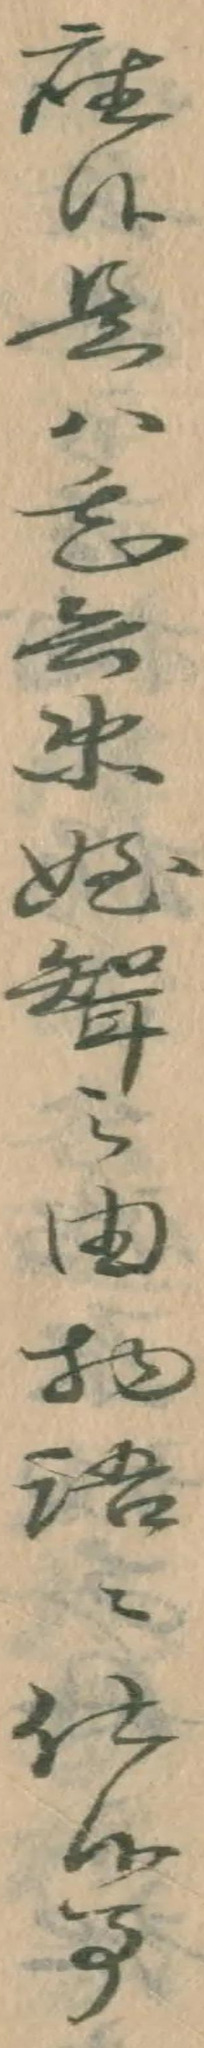座候是は甚兵衛姪聟之由物語に仕候事
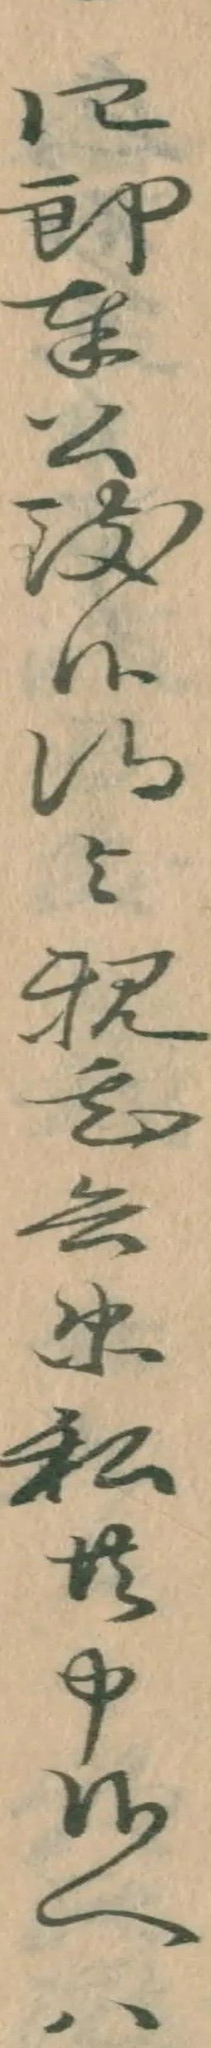一四郎奉公致候得与親甚兵衛私共申候へは
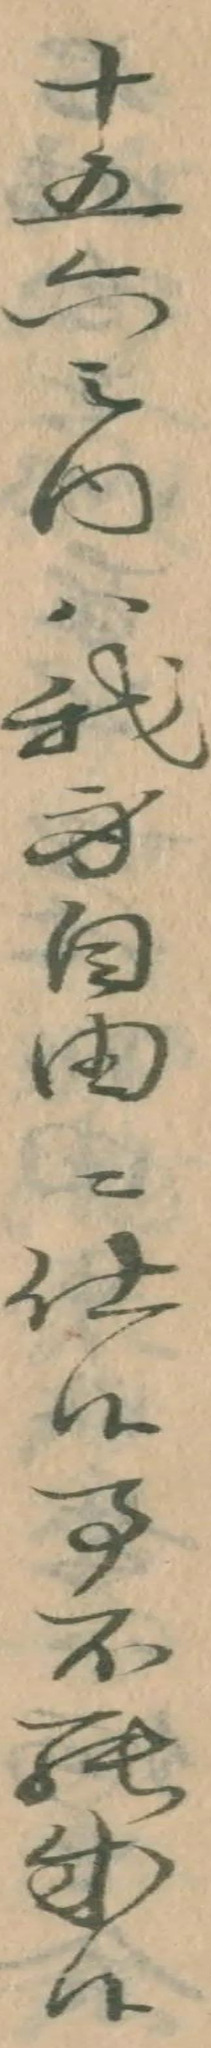十五六之内は我身自由に仕候事不罷成候

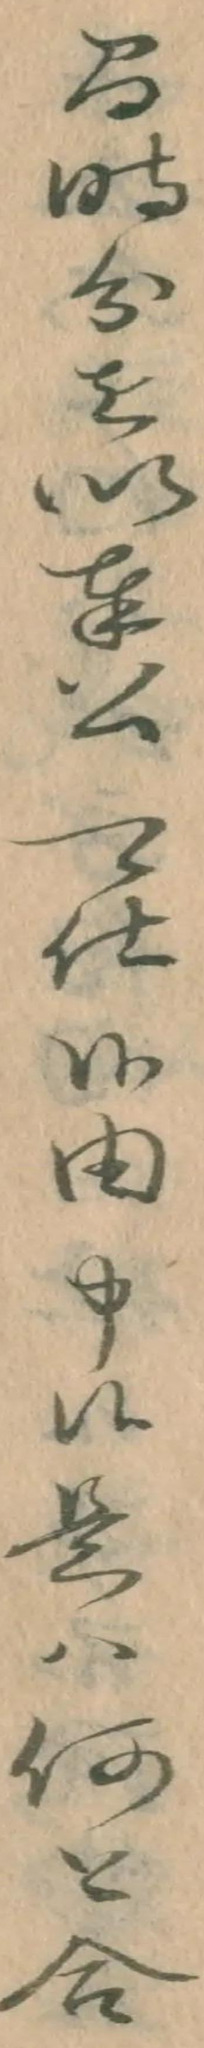間時分を以奉公可仕候由申候是は何と合
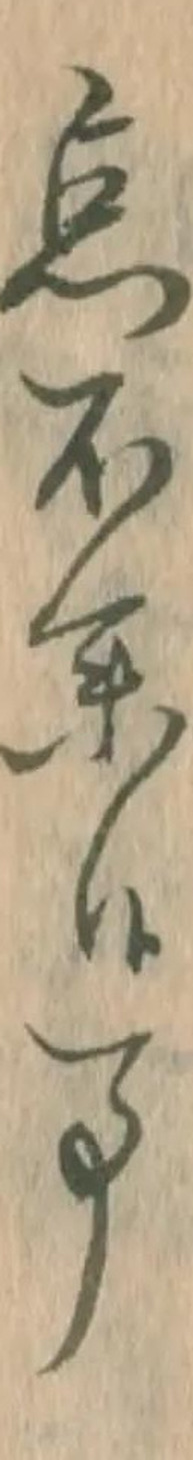点不参候事
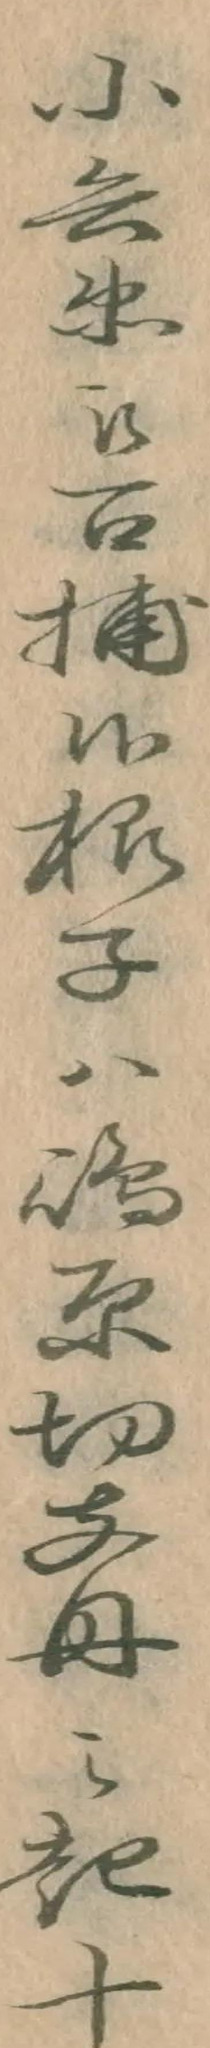一小兵衛被召捕候様子は島原切支丹之起十
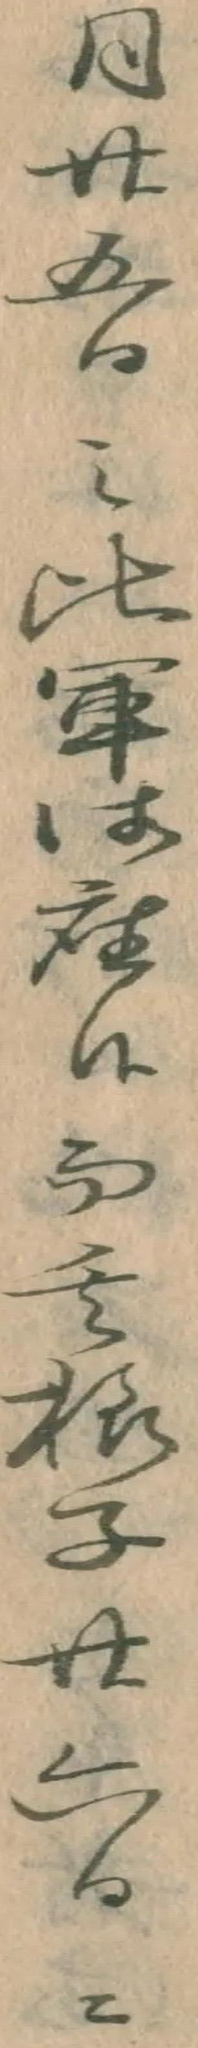月廿五日之比軍御座候而其様子廿六日に
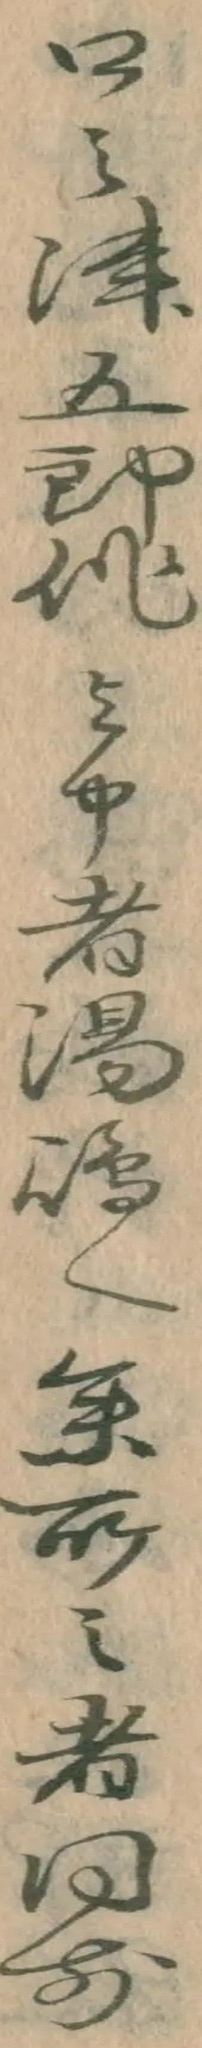口之津五郎作与申者湯島へ参所之者同前
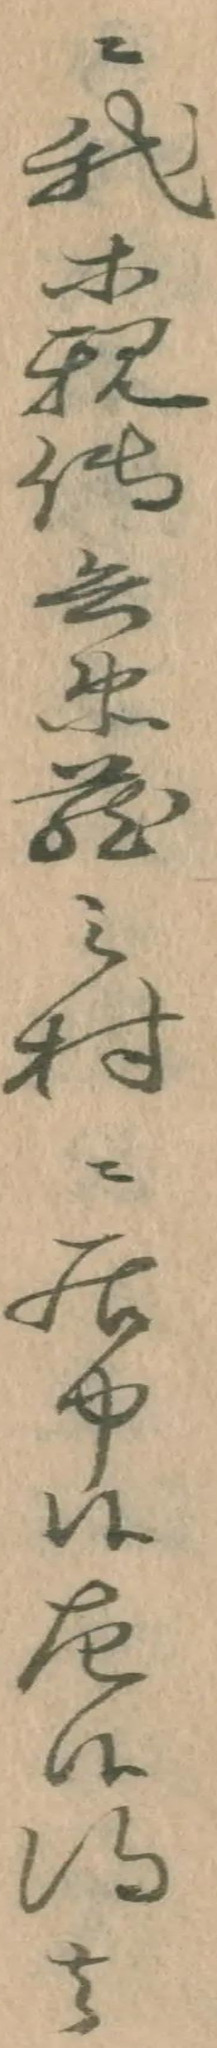に我等親伝兵衛蔵之村に居申候左候得者
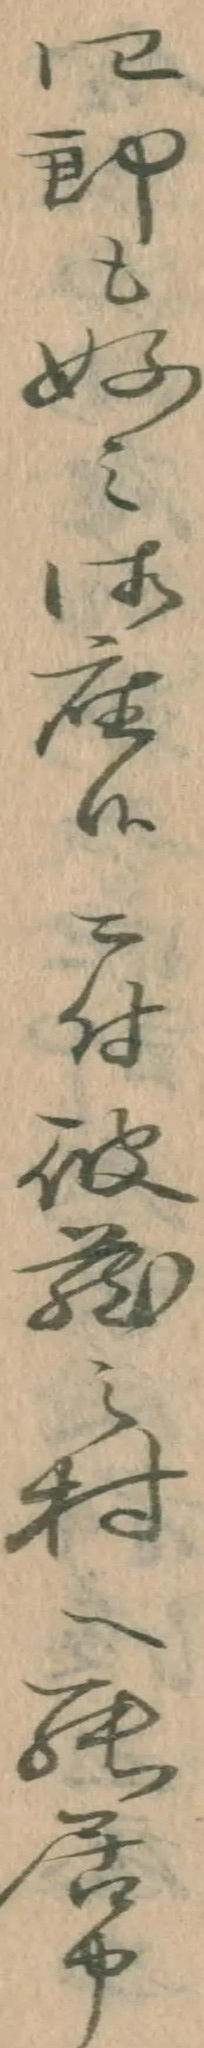四郎も好み御座候に付彼蔵之村へ罷居申
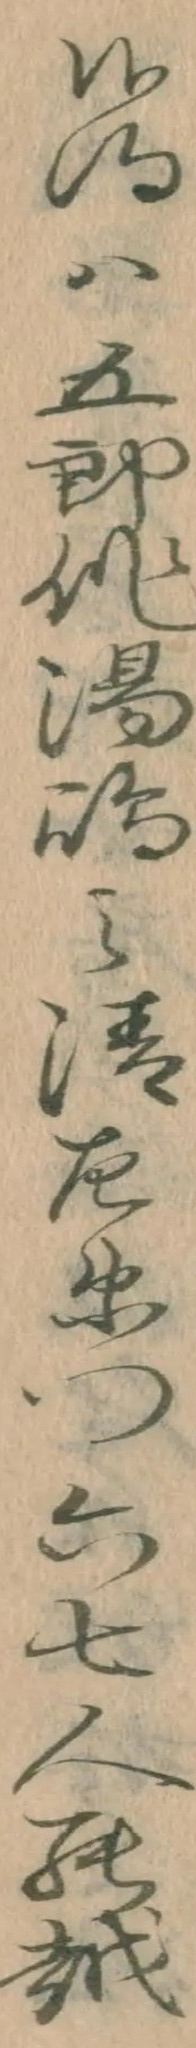候得は五郎作湯島之清左衛門六七人罷越
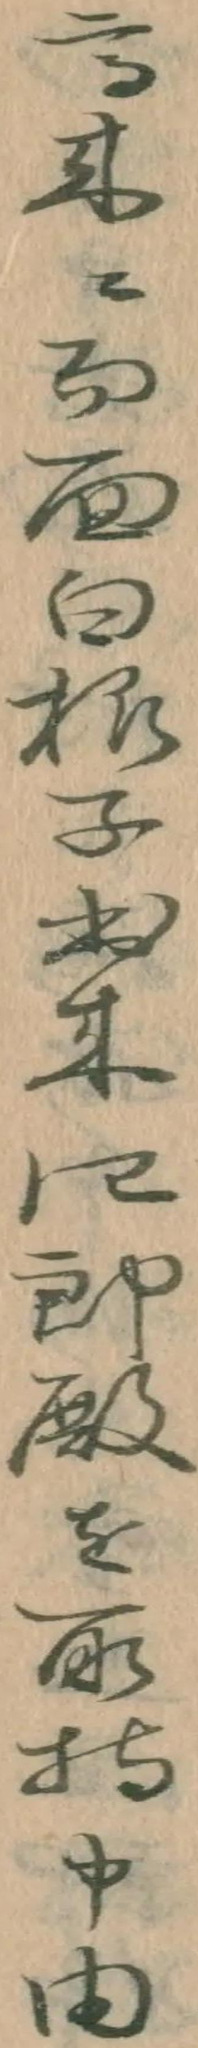高来に而面白様子出来四郎殿を取持申由
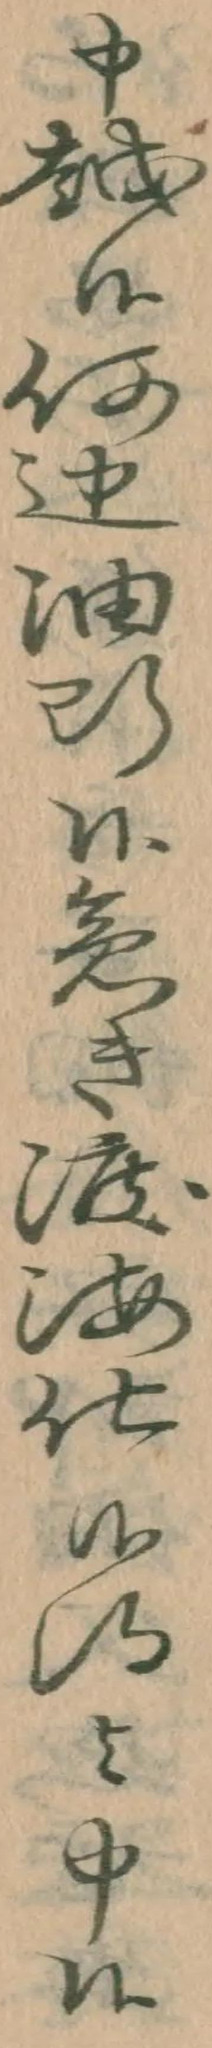申越候何迚油断候急き渡海仕候得与申候
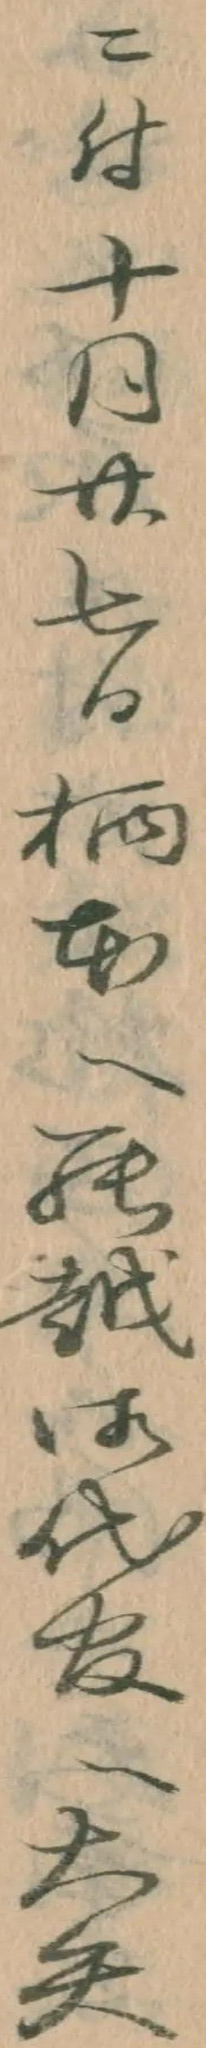に付十月廿七日栖本へ罷越御代官へ大矢
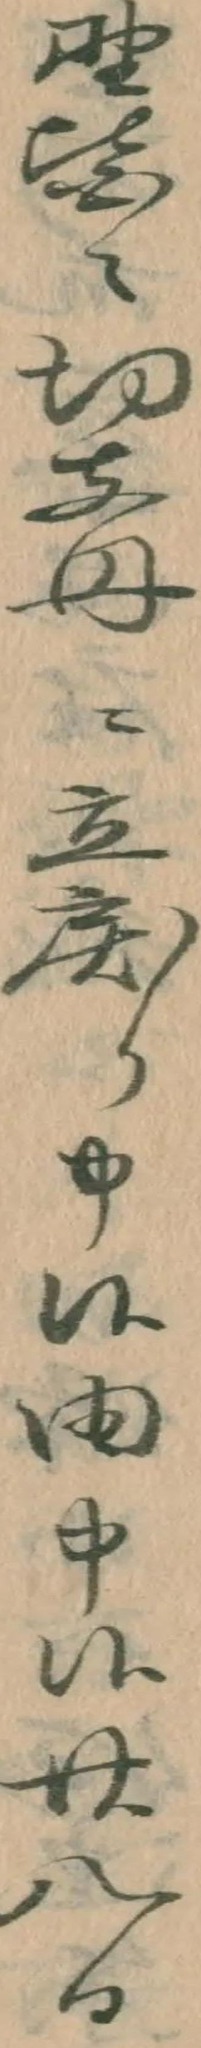野皆々切支丹に立戻り申候由申候廿八日
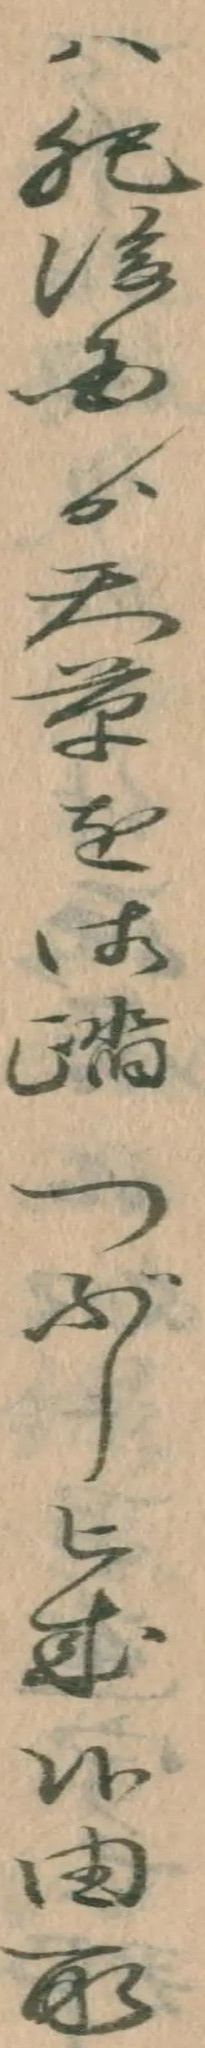は肥後国ゟ天草を御踏つぶし被成候由取
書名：切支丹御退治記 49巻. [6]
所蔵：国立国会図書館 National Diet Library, JAPAN
